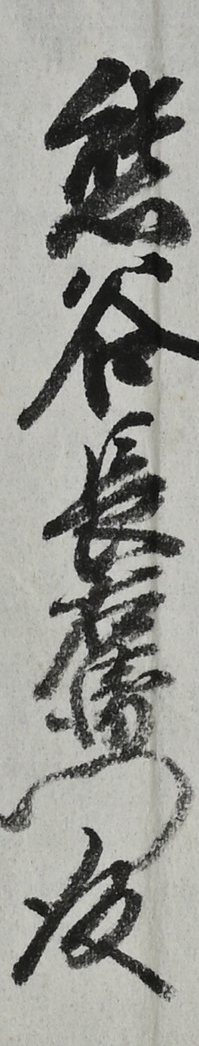熊谷長右衛門殿
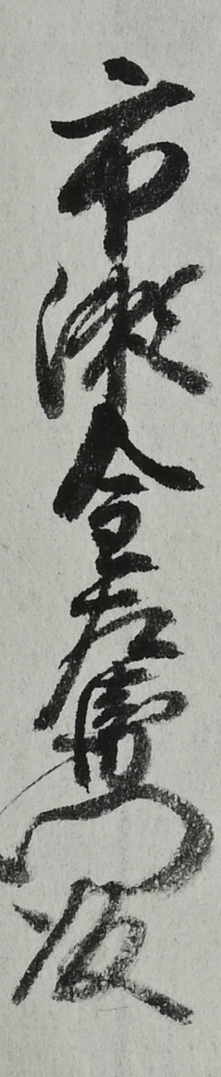市瀬金左衛門殿
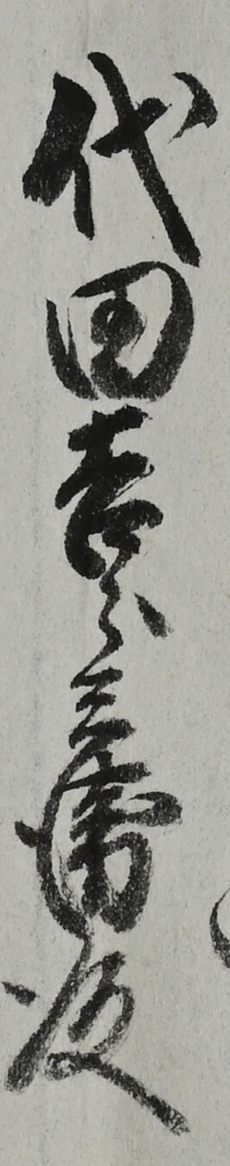代田吉郎兵衛殿
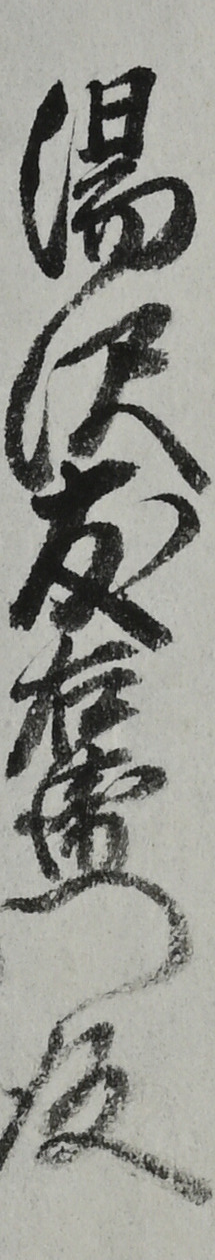湯沢友右衛門殿

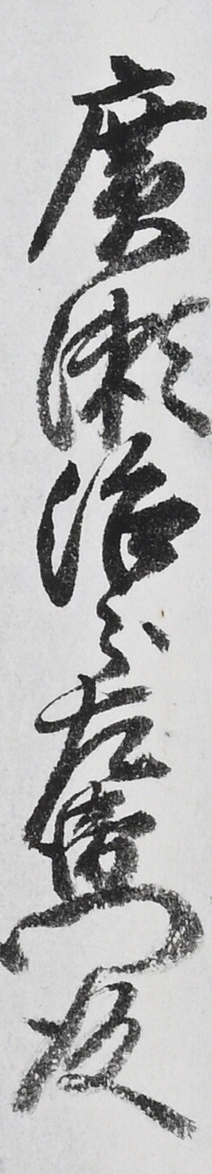上条治左衛門殿
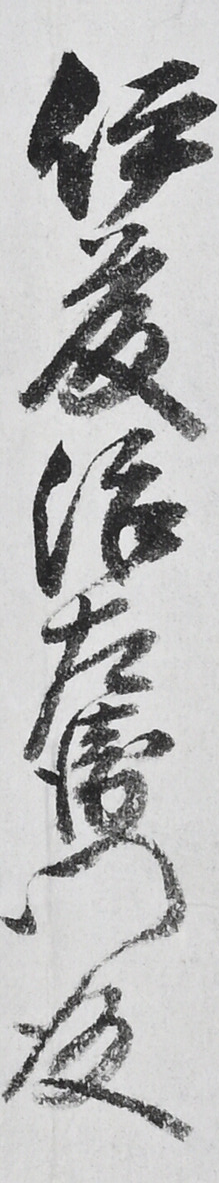上条治左衛門殿
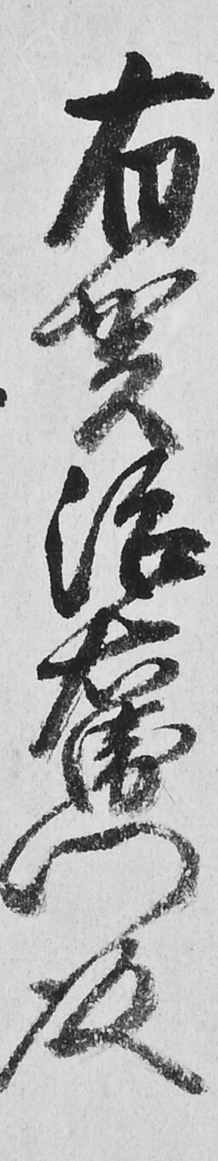山川治良右衛門殿
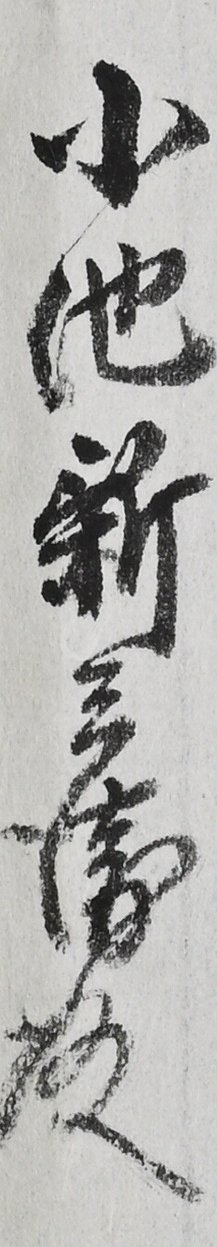小池新兵衛殿
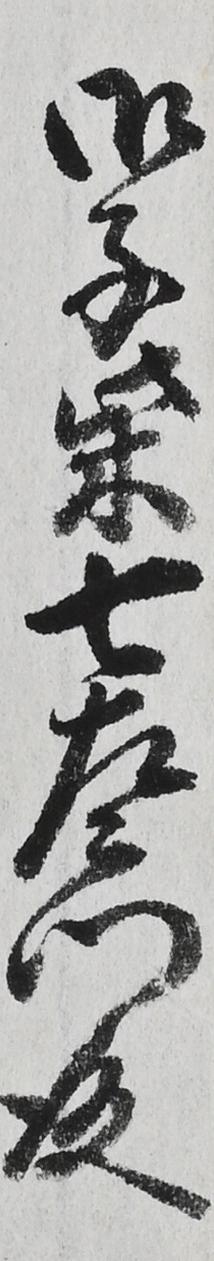御子柴七左衛門殿
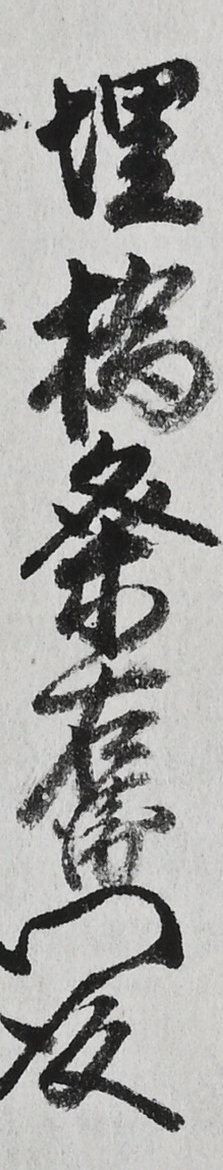埋橋条右衛門殿
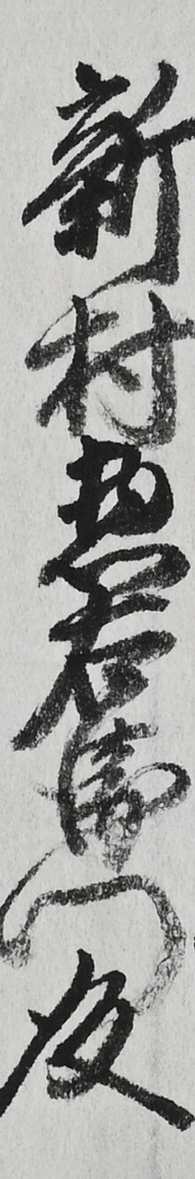新村惣右衛門殿
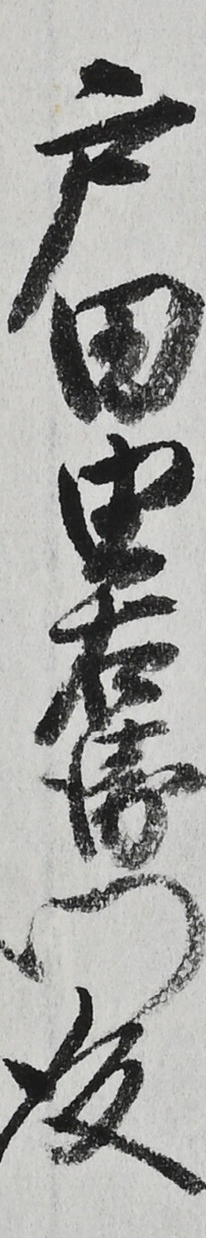戸田由右衛門殿
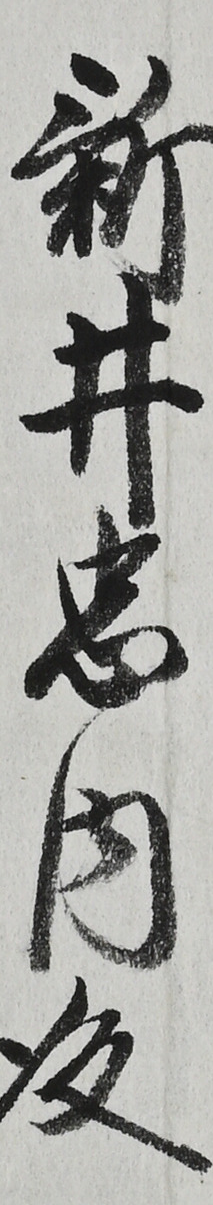新井忠内殿
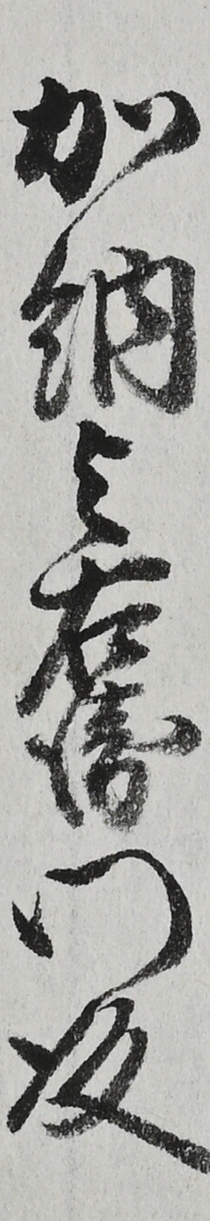加納与右衛門殿
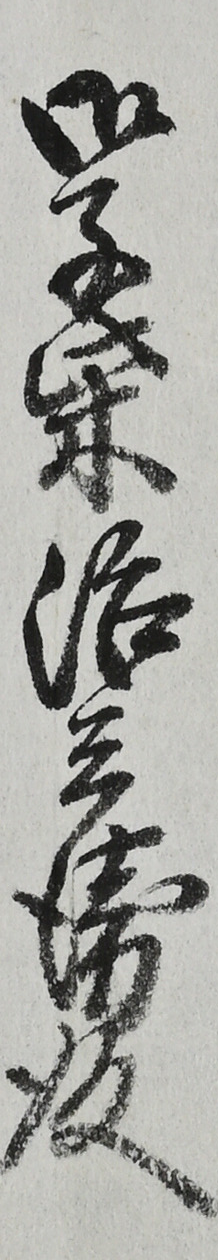御子柴治兵衛殿
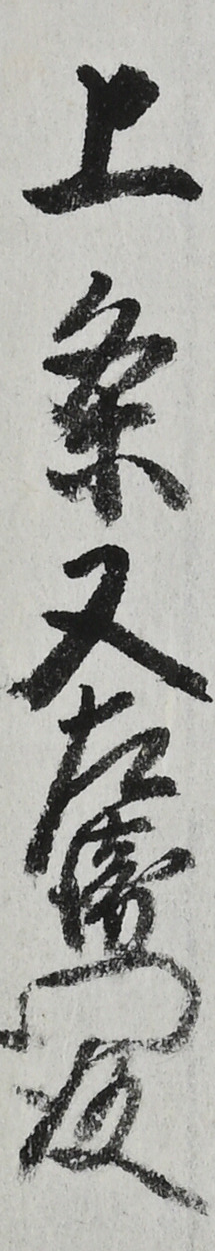上条又左衛門殿
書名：祭礼相撲四本柱土俵幷櫓太鼓免許
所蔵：伊那市立高遠町図書館・合同会社AMANE
